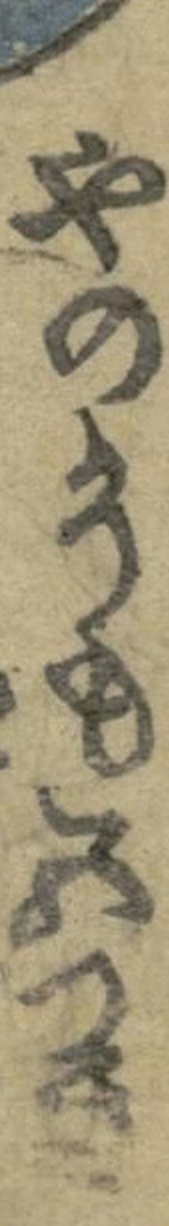やのかりも五つき
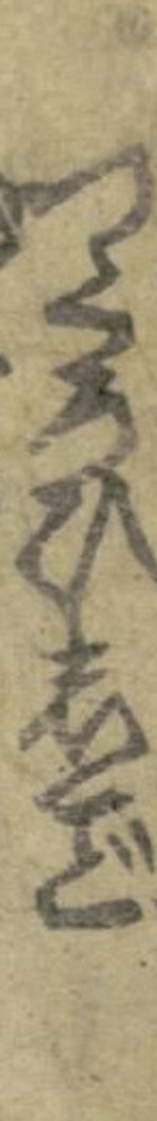つくろひしごと
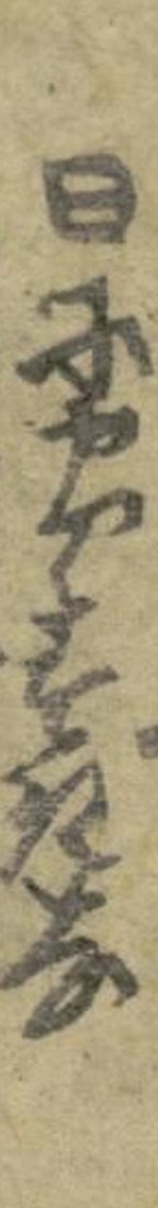日にヤアすきな
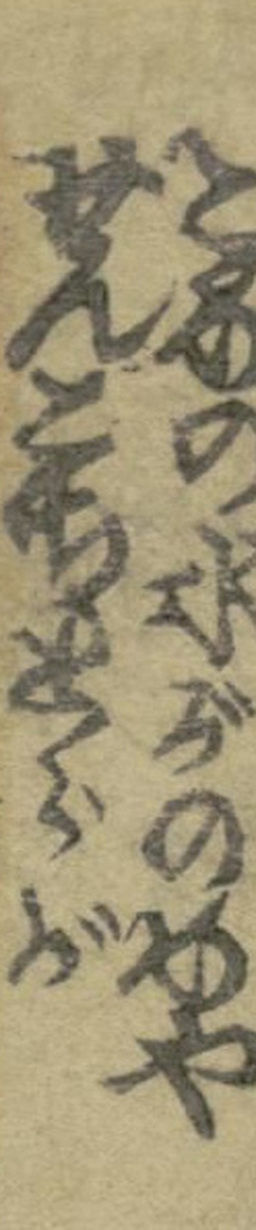せんこちとらが
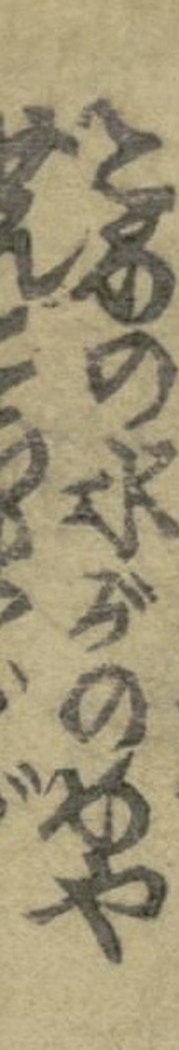とねの水がのめや
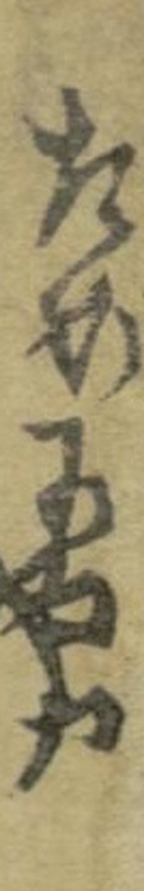ためにやア
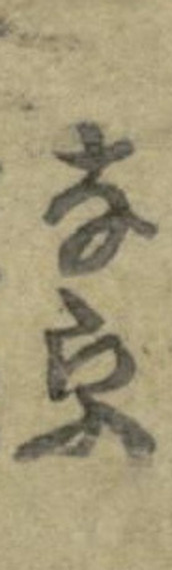ならふ
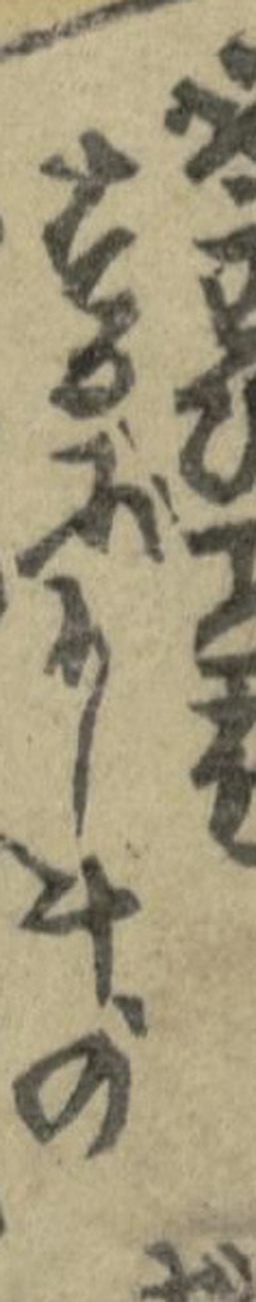するにかしまの
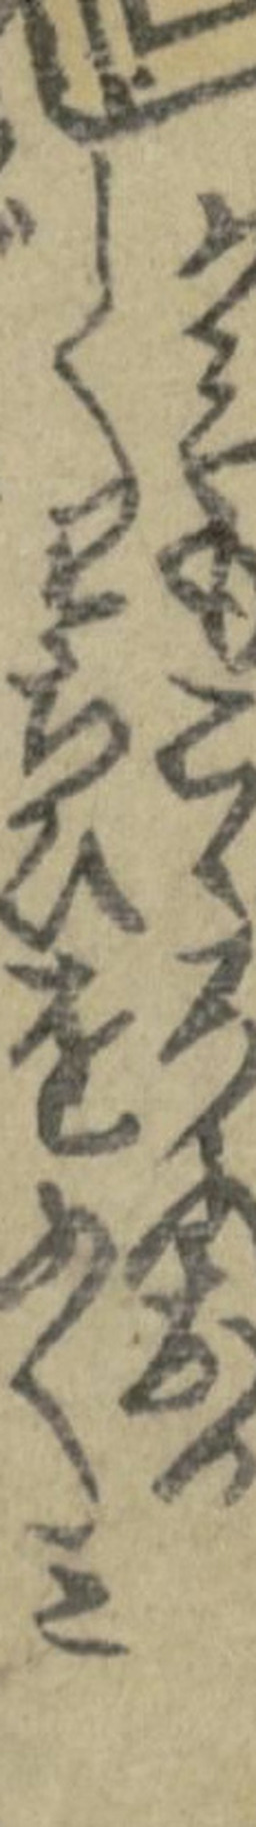しくわちひをにくみ
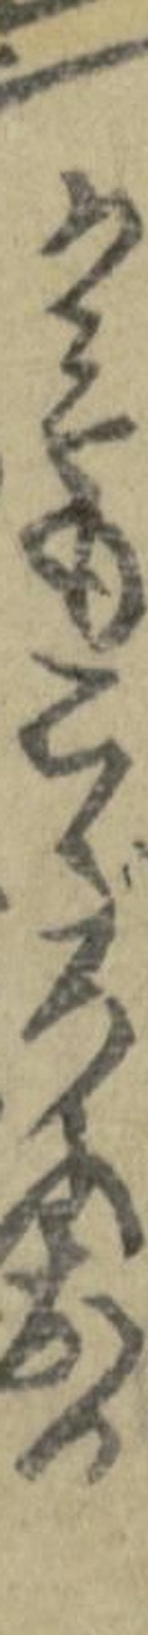かみもこゝろにおか
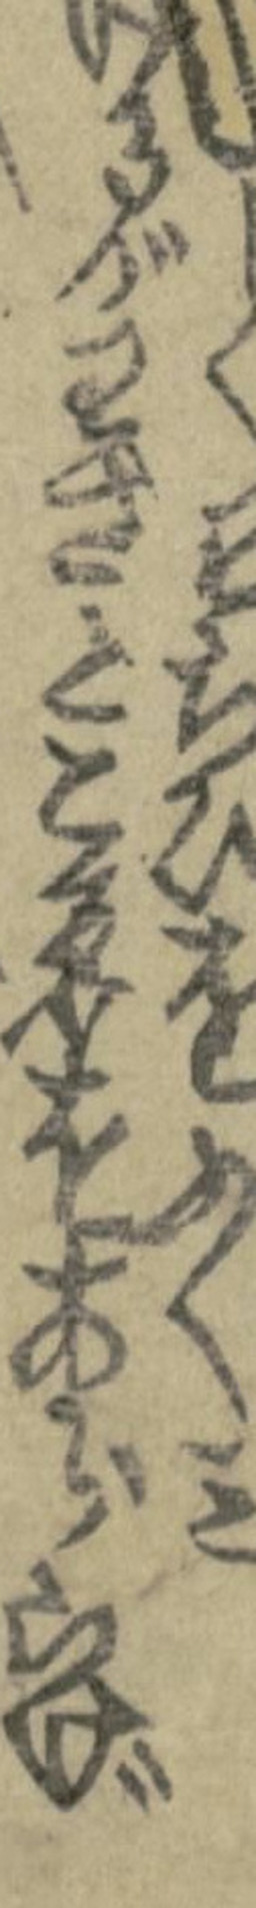いるがわさとこゑをあららげ
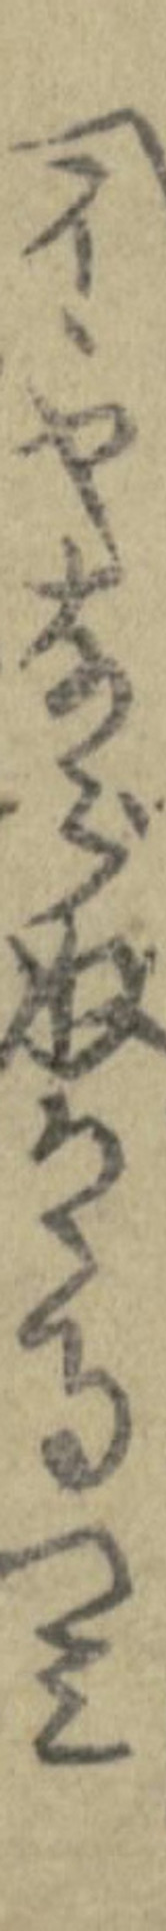〽イヽヤならぬかゝるつみ
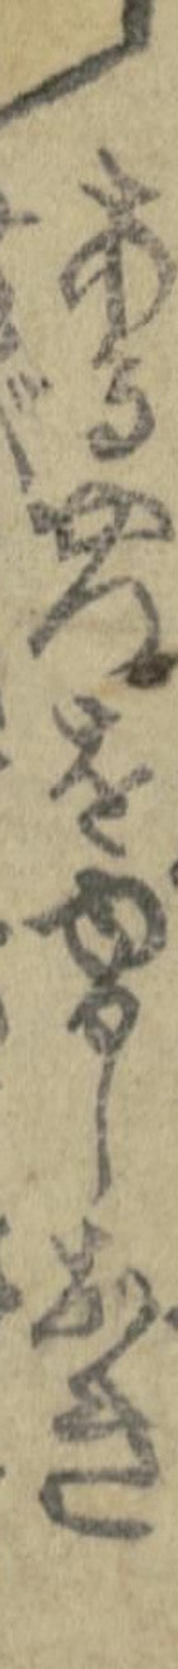あるやつをゆるしおき
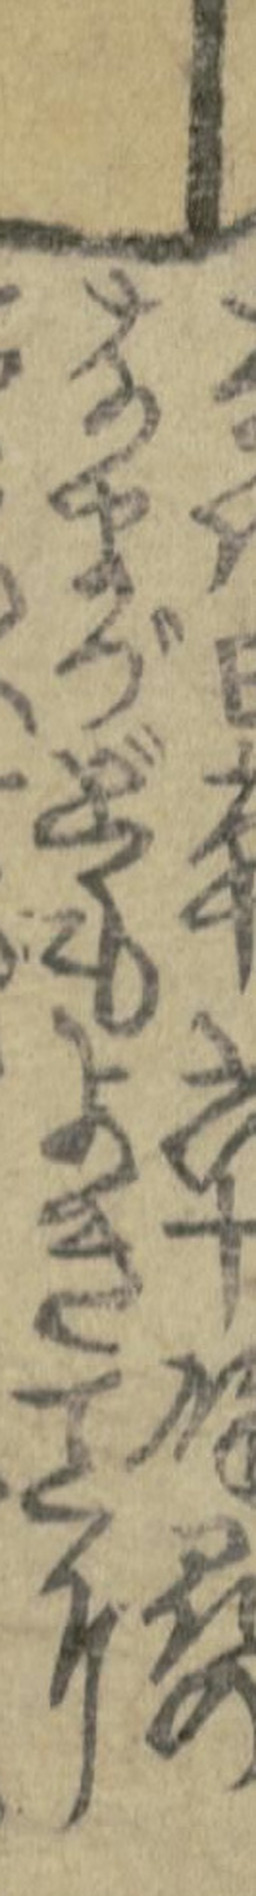なまづどもよきことに
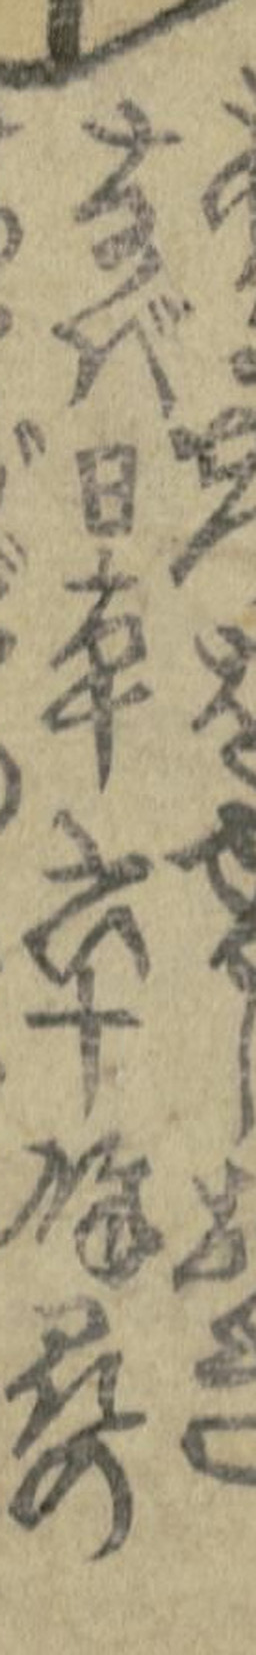なば日本六十余州の
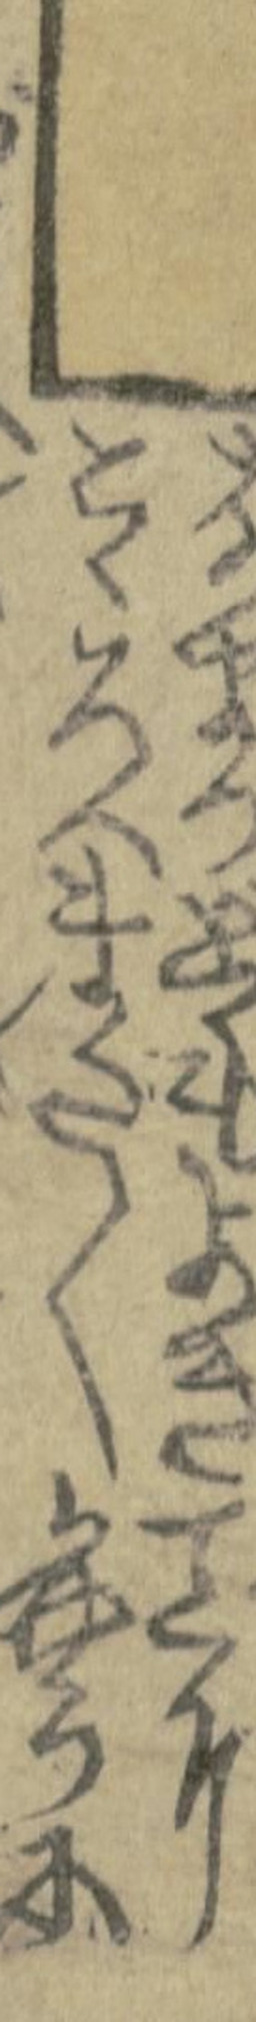こゝろへまた〳〵かやうに
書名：生捕ました三度の大地震
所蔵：東京大学地震研究所図書室 Earthquake Research Institute Library, The University of Tokyo, JAPAN
